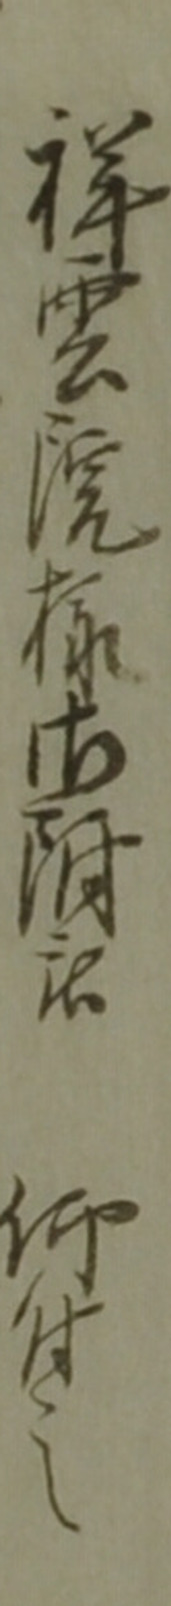祥雲院様御附被仰付之
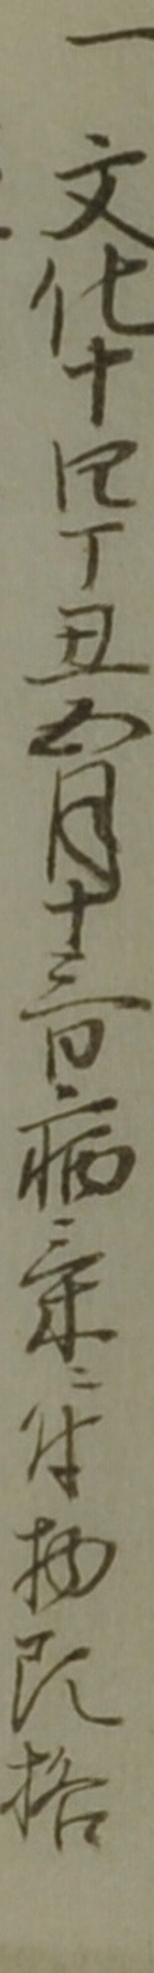一文化十四丁丑五月十三日病気ニ付物頭格
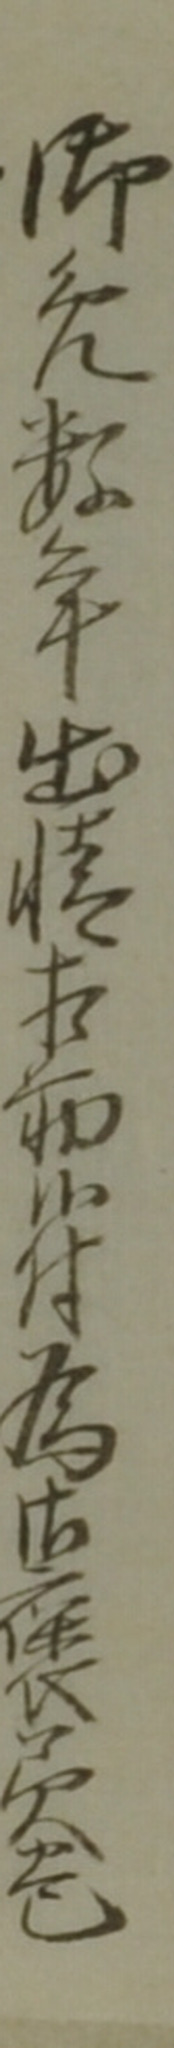御免数年出精相勤候付為御褒美巻
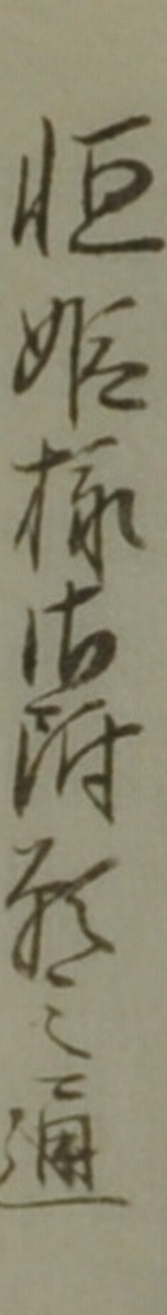恒姫様御附願之通
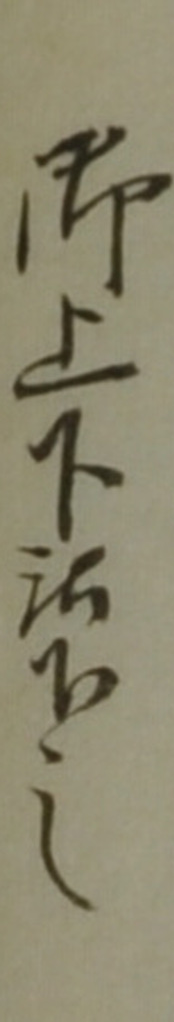御上下被下之
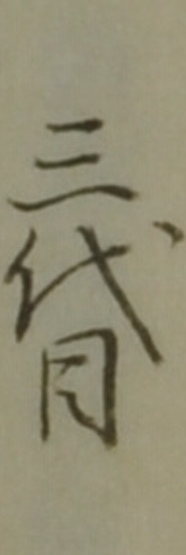三代目
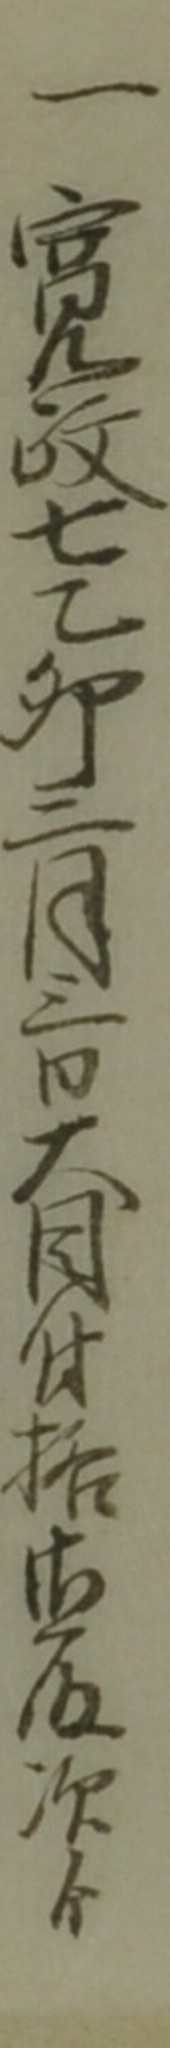一寛政七乙卯三月三日大目付格御取次ゟ
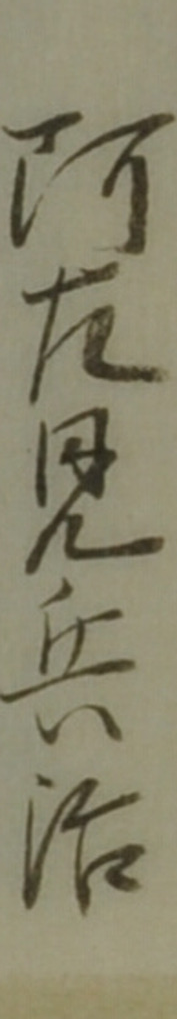阿左見兵治
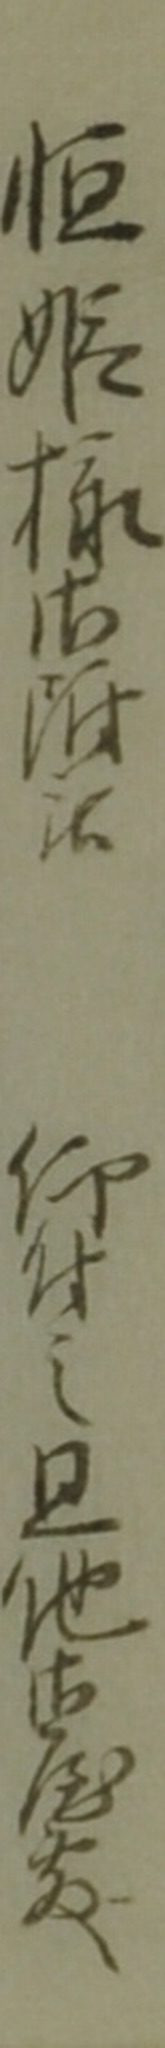恒姫様御附被仰付之且他御屋敷
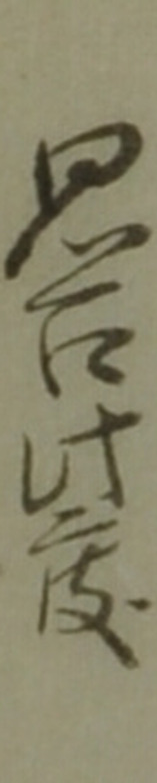思召此度
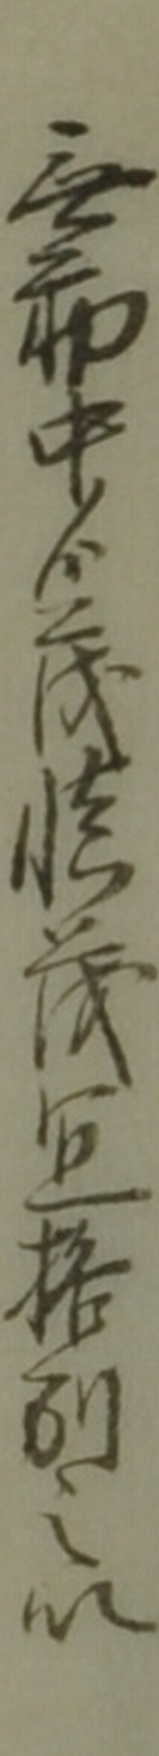無勤中ゟ茂慎茂宜格別之以
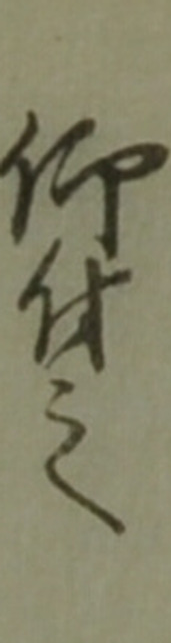仰付之
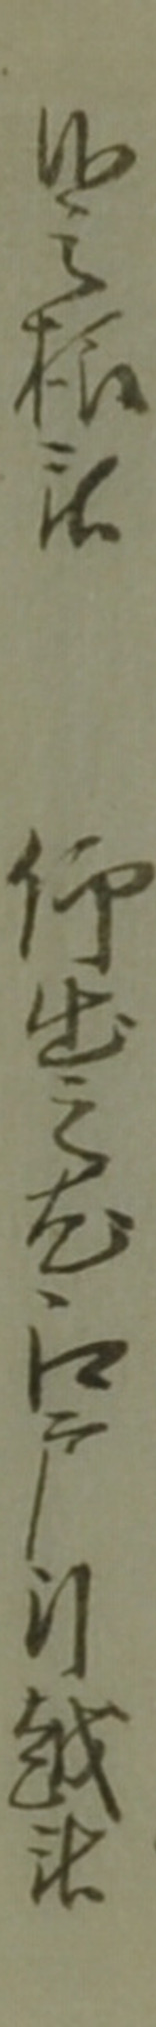候之様被仰出之尤江戸引越被
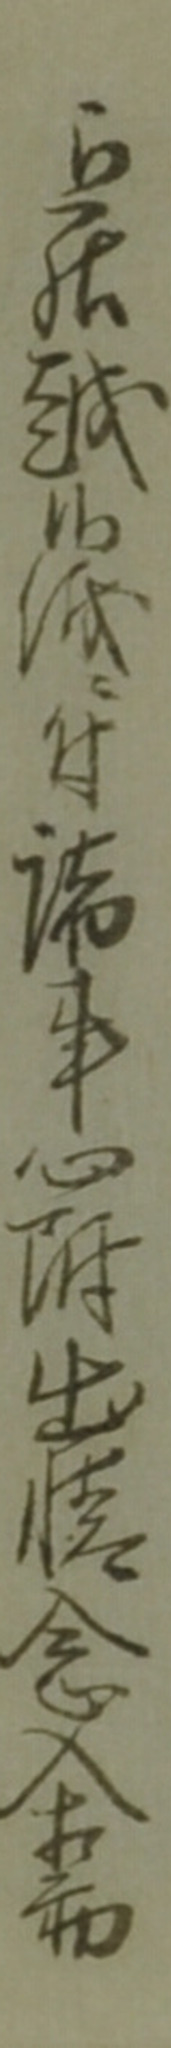江罷越御儀ニ付帰参心附出精念入御勤
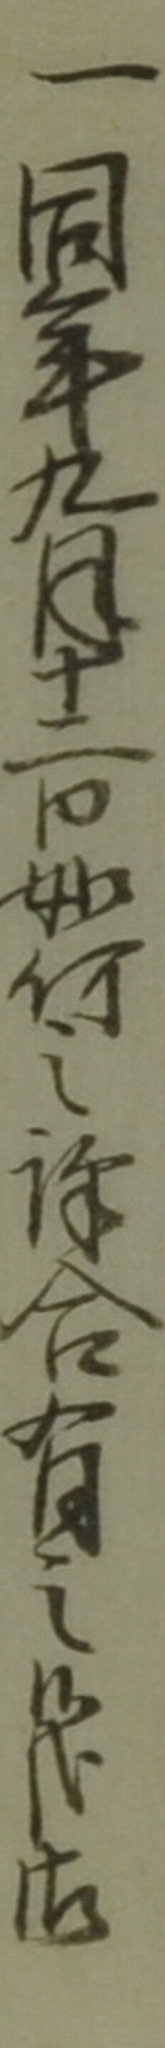一同年九月十二日如何之◻︎合有之御◻︎御
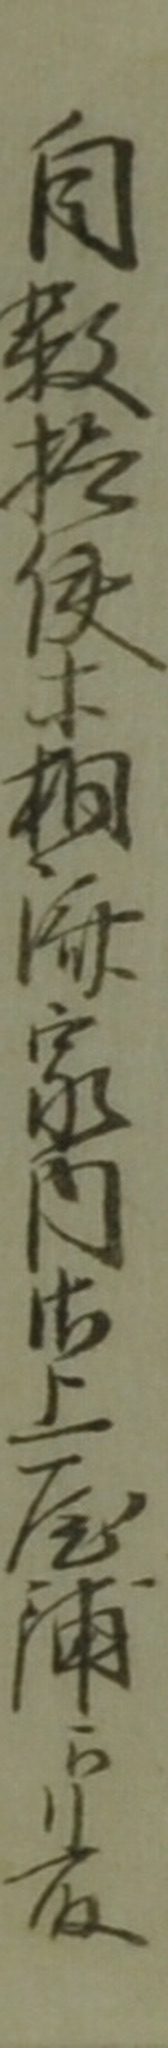自殺検使等相済家内御上屋鋪江引取
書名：諸御役代々録（六）
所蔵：伊那市立高遠町図書館・合同会社AMANE
